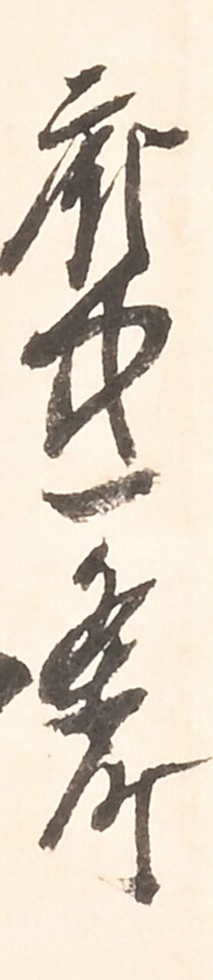府中一条町
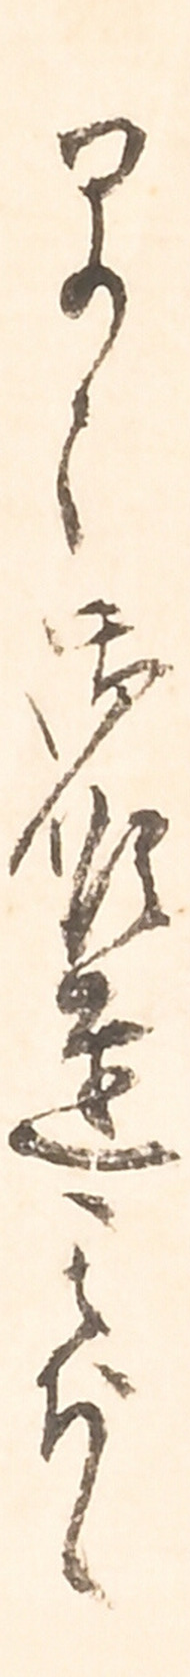早々御順達可被下候

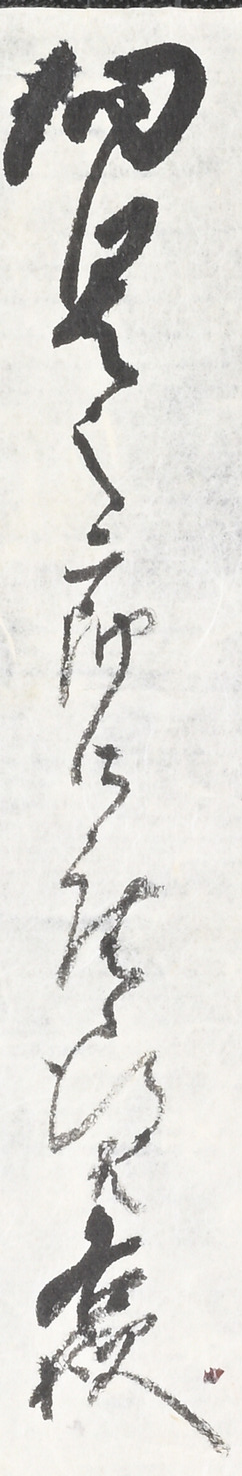向暑之節御座候得共各様
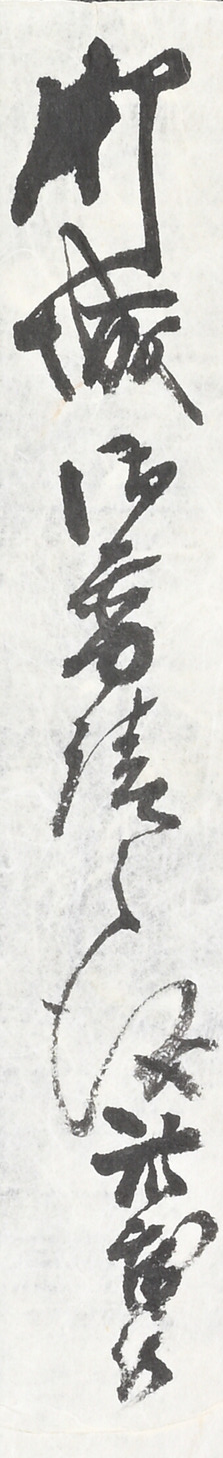御城御普請之儀此度被
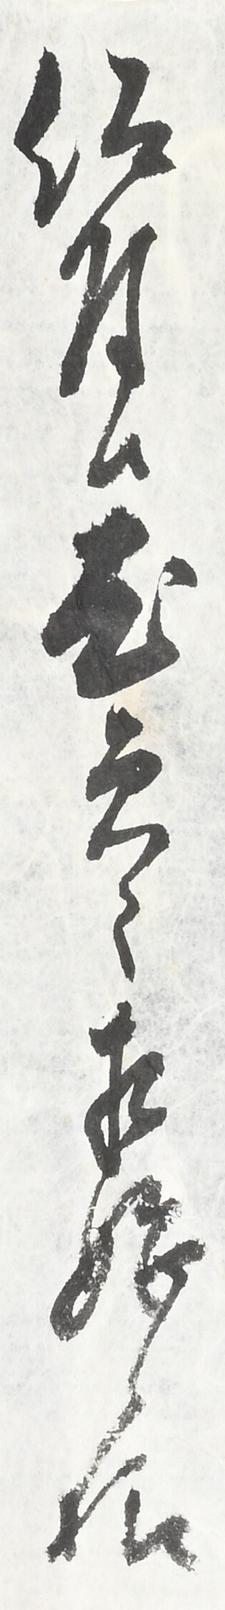仰付候尤急々相始候様
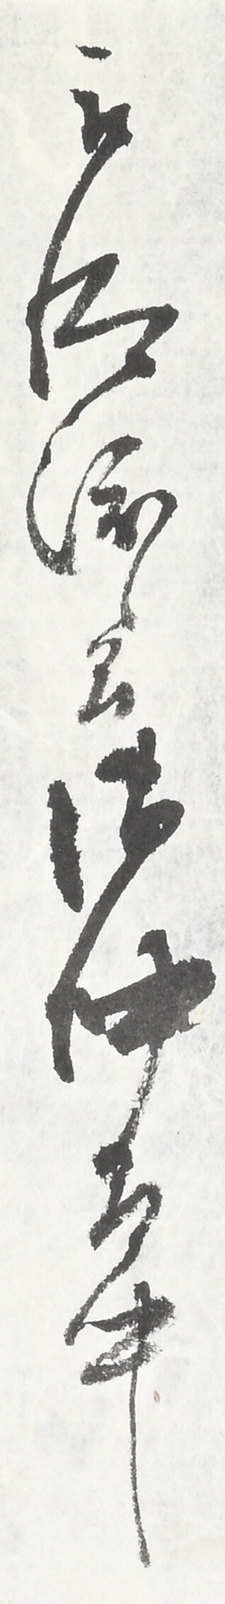被仰渡候間御仲間中
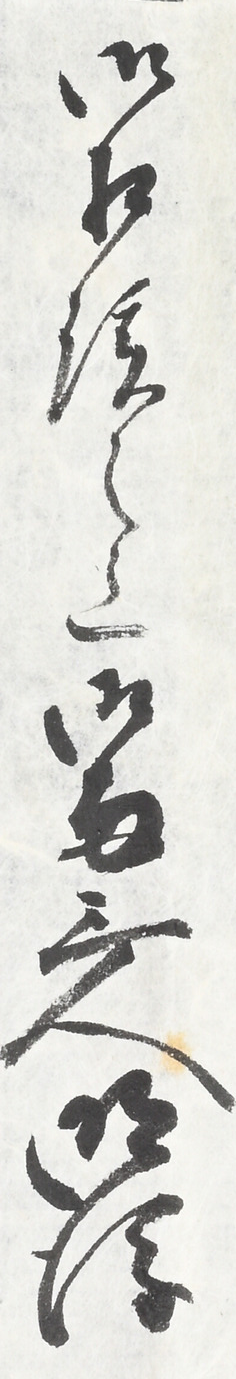御相談之上御両三人明後
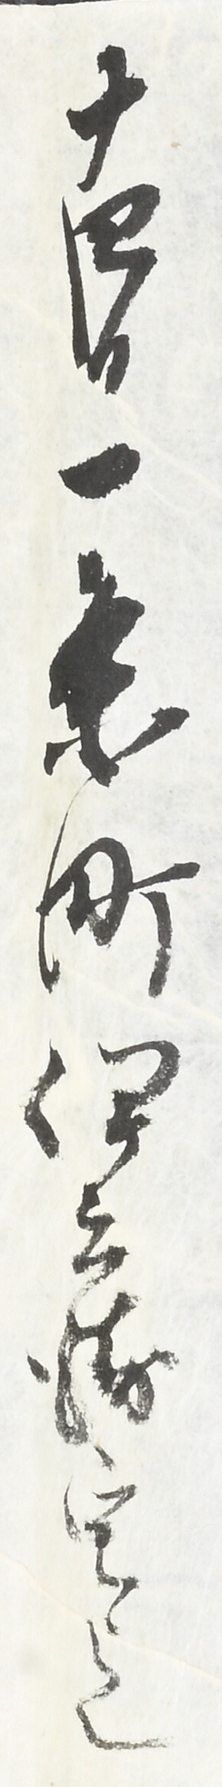十四日一条町伊兵衛宅迄

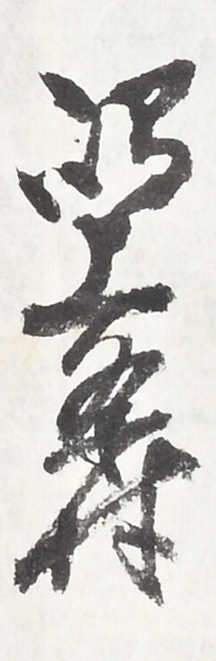嶋上条村
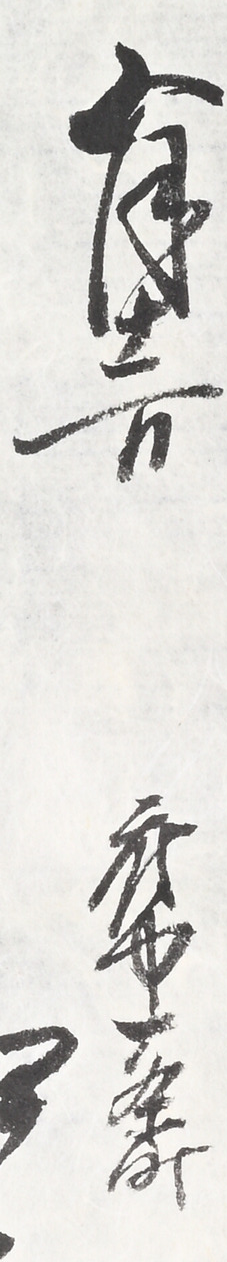五月十二日府中一条町
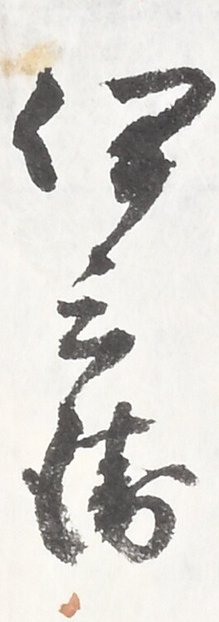伊兵衛
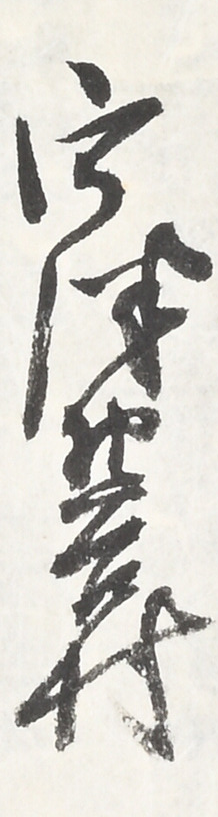宇津野谷村
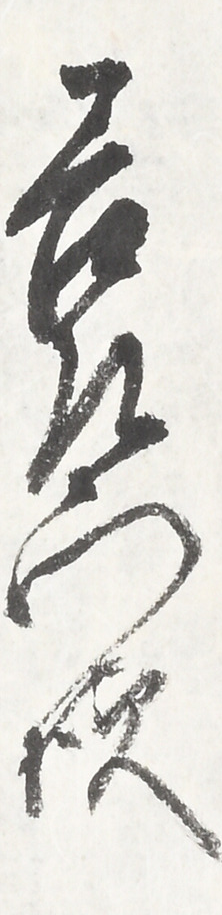善左衛門様
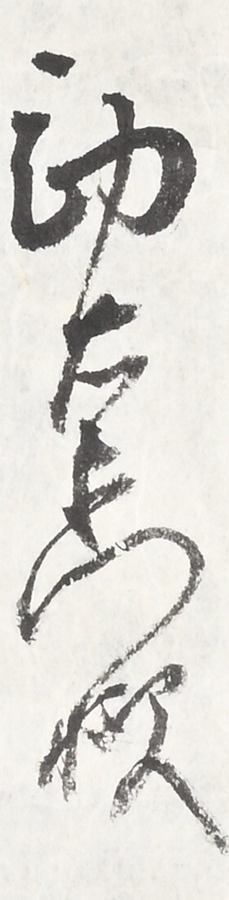勘右衛門様
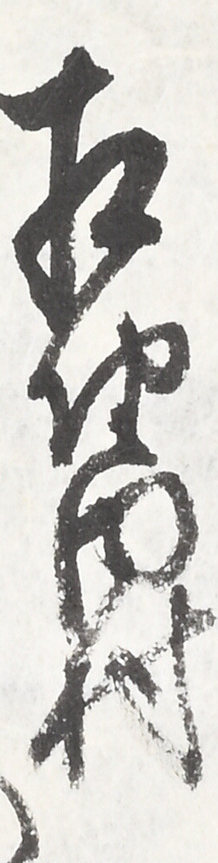相野田村
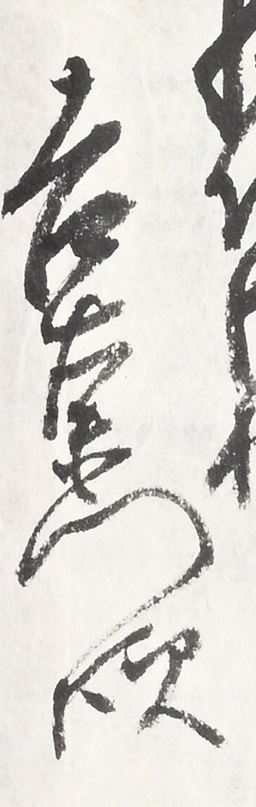吉右衛門様
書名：廻章
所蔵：伊那市立高遠町図書館・合同会社AMANE
